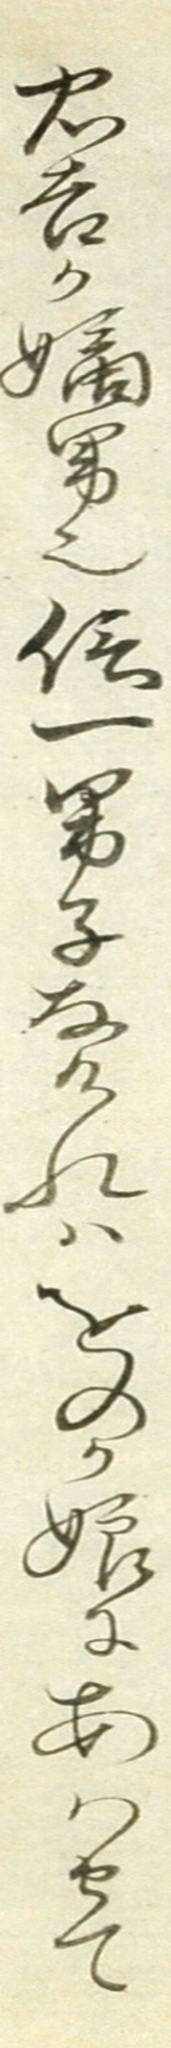忠吉か嫡男也信一男子なけれはをのか娘にあはせて
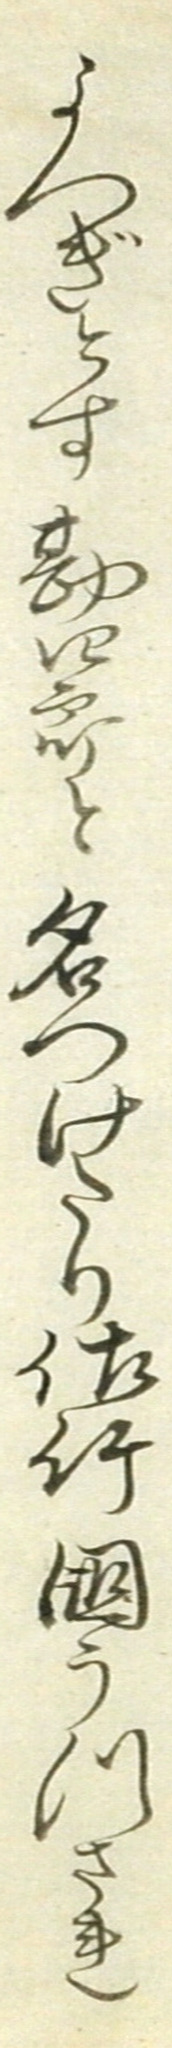よつぎとす勘四郎と名つけたり佐竹国うつされ
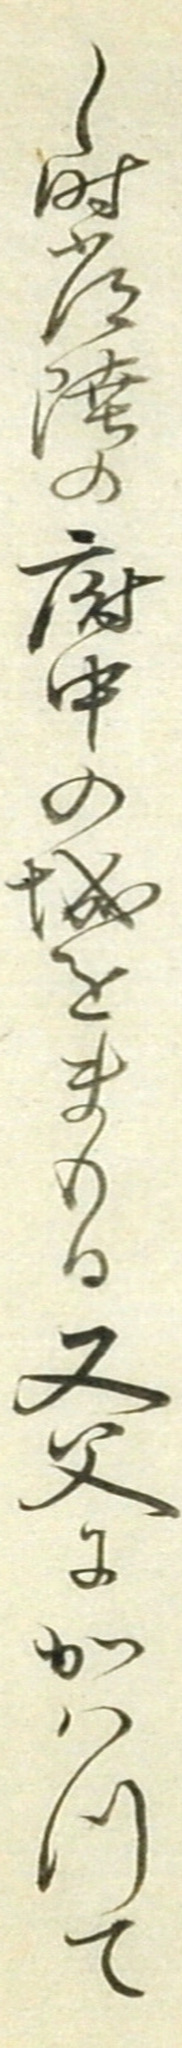し時常陸の府中の城をまもる又父にかはつて
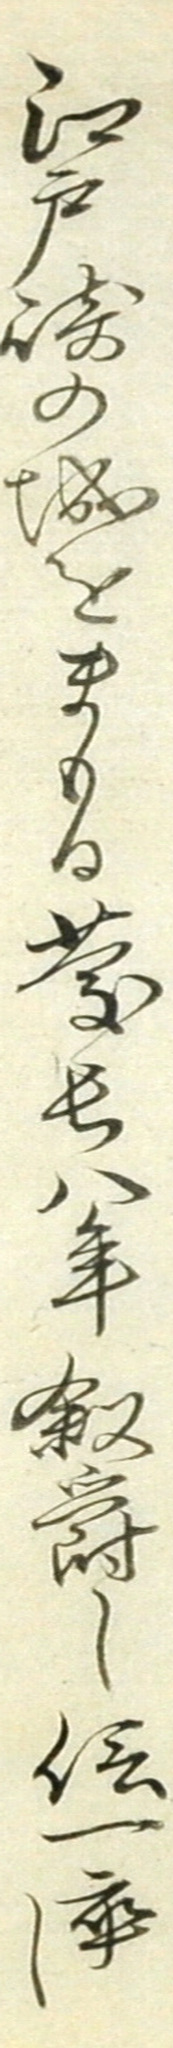江戸崎の城をまもる慶長八年叙爵し信一卒し
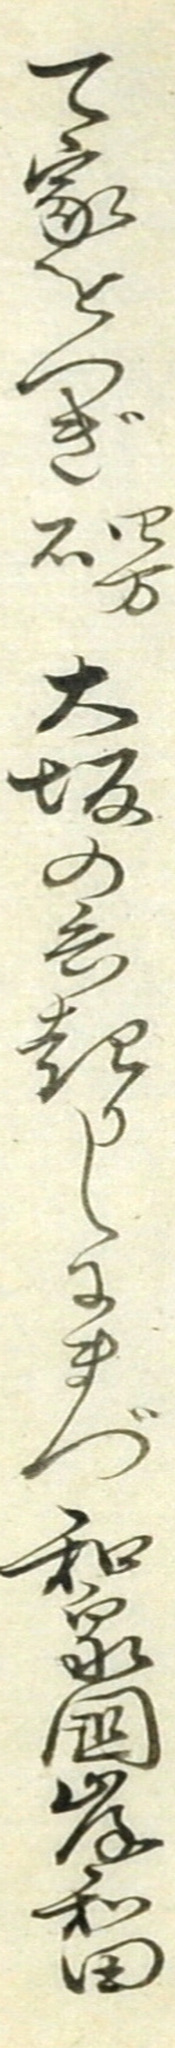て家をつぎ四万石大坂の兵起りしにまづ和泉国岸和田
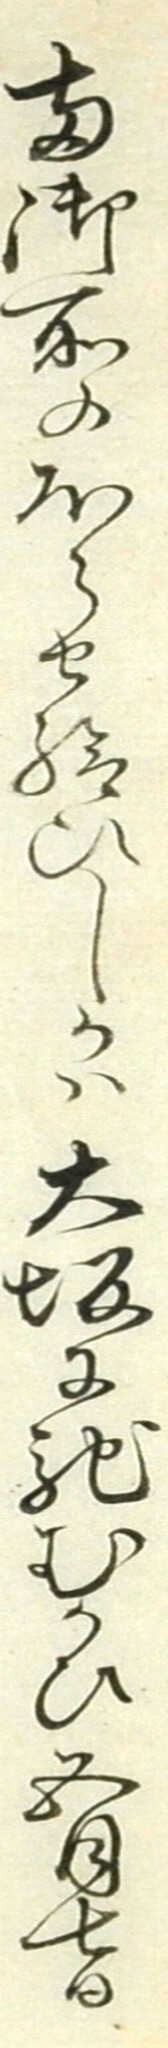両御所のほらせ給ひしかは大坂に馳むかひ五月七日
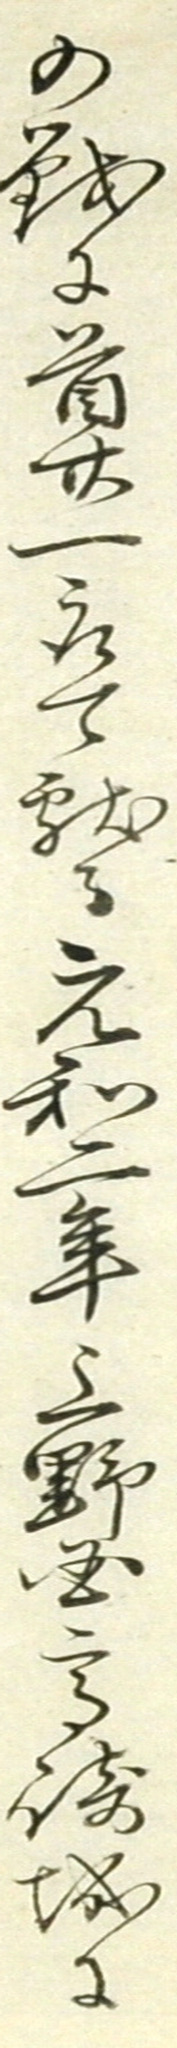の戦に首廿一取て献る元和二年上野国高崎城に
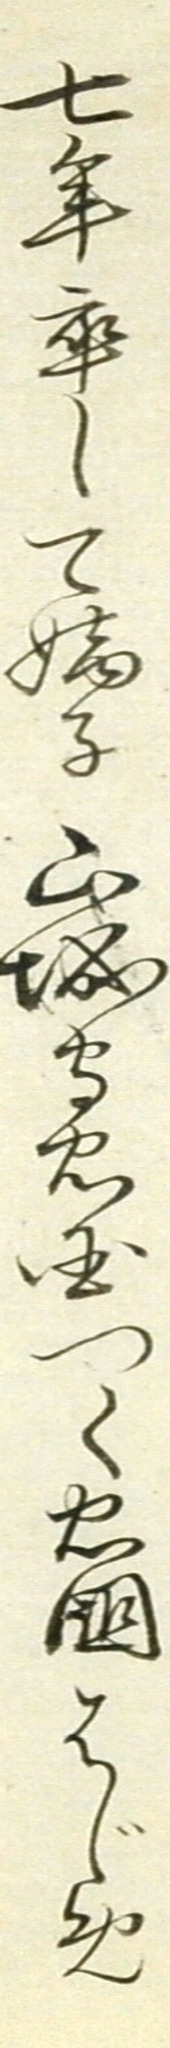七年卒して嫡子山城守忠国つく忠国はじめ
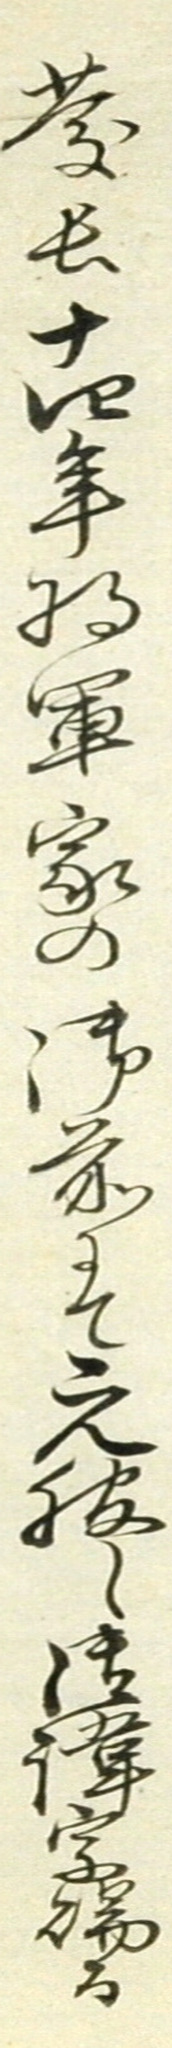慶長十四年将軍家の御前にて元服し御諱字賜る
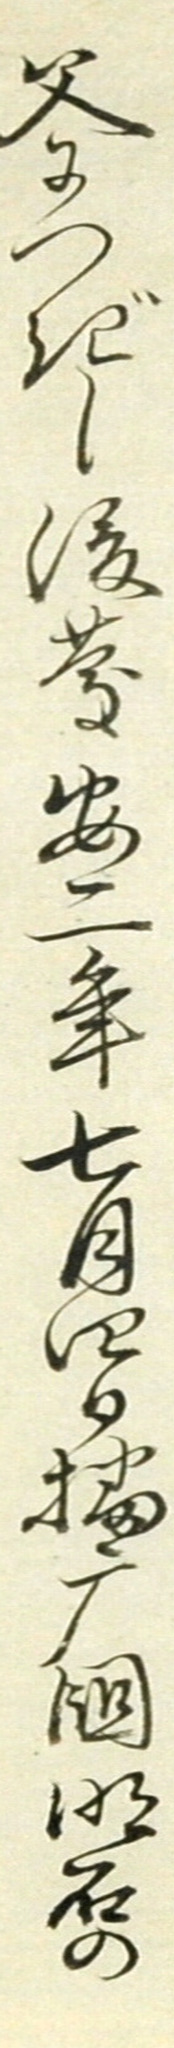父につぎし後慶安二年七月四日播磨国明石の
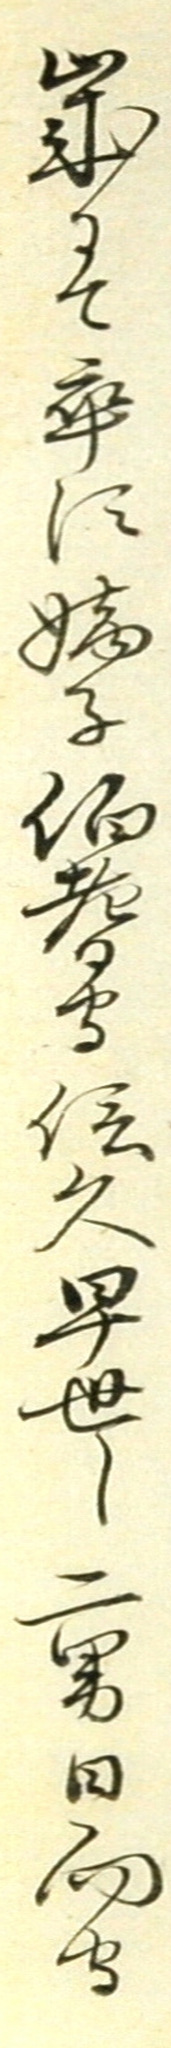歳にて卒す嫡子伯耆守信久早世し二男日向守

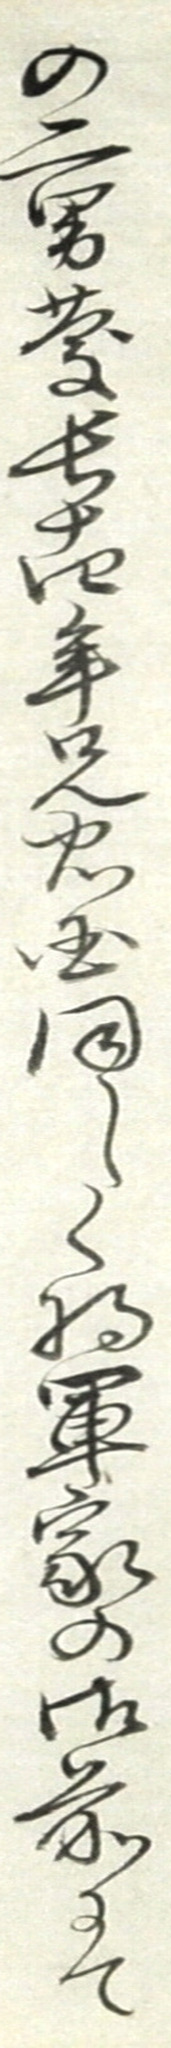の二男慶長十四年兄忠国同しく将軍家の御前にて
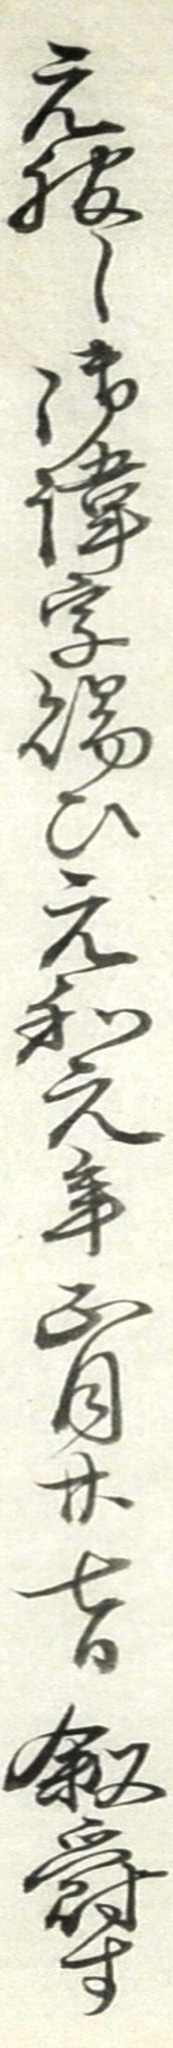元服し御諱字賜ひ元和元年正月廿七日叙爵す
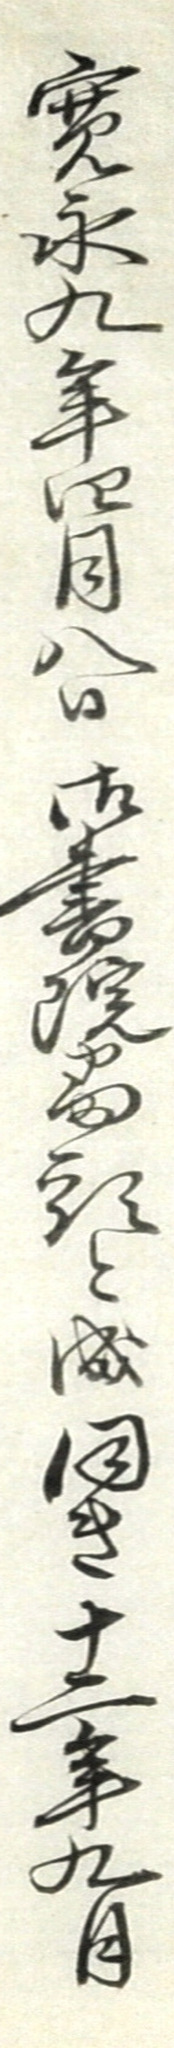寛永九年四月八日御書院番頭と成同き十二年九月
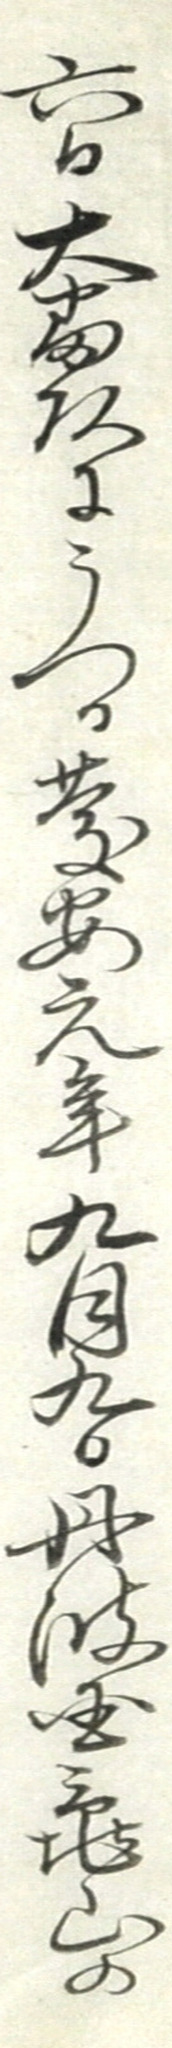六日大番頭にうつる慶安元年九月九日丹波国亀山の
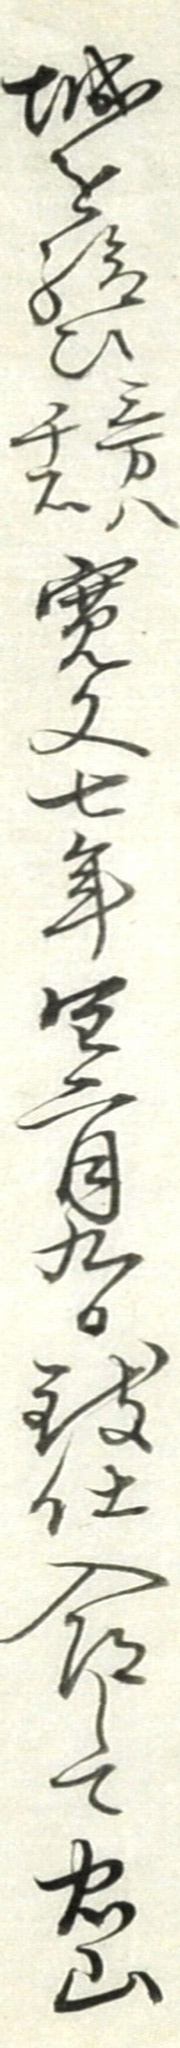城を給ひ三万八千石寛文七年閏二月九日致仕入道して忠山
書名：藩翰譜（二・三）
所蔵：伊那市立高遠町図書館・合同会社AMANE
